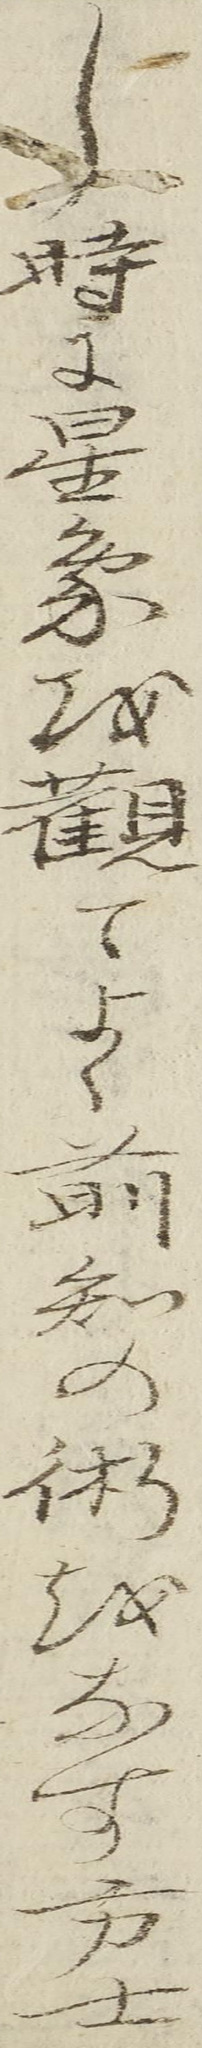し時に星象を観てよく前知の術をなす方士

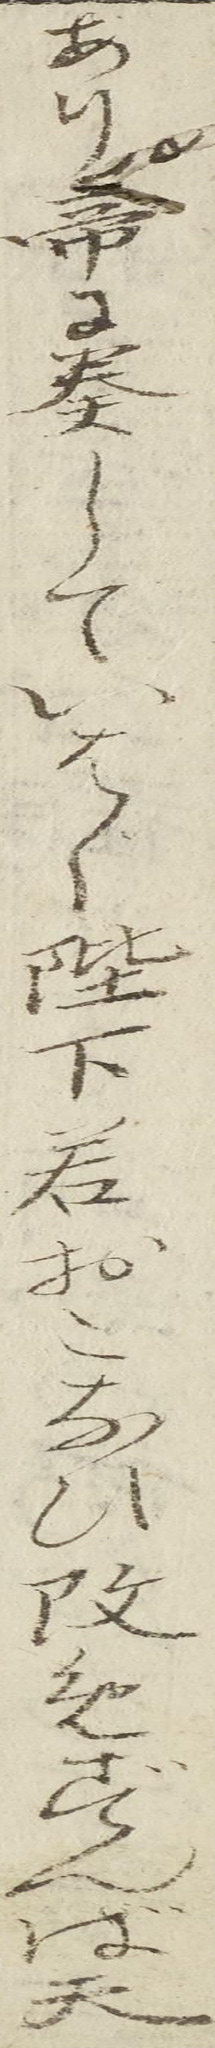あり帝に奏していはく陛下若おこなひ改めずんば天
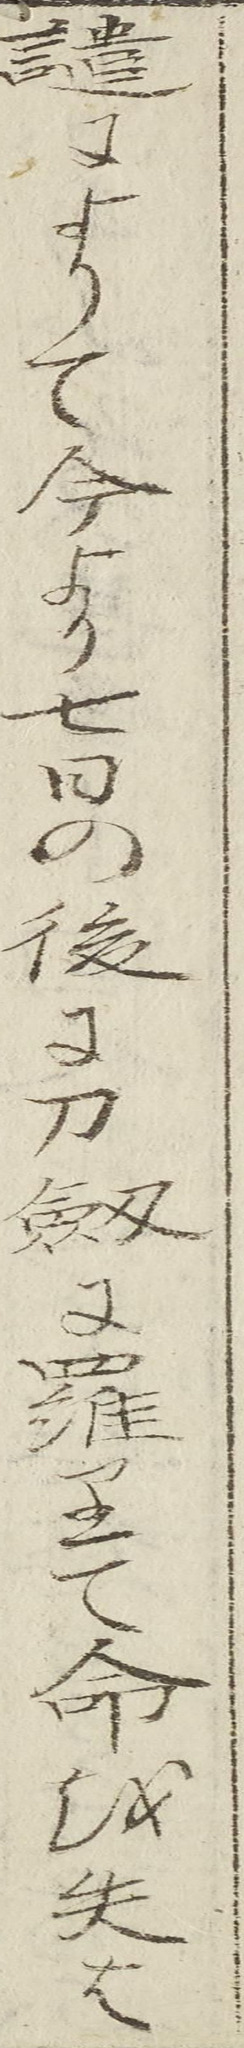譴によりて今より七日の後に刀剱に羅りて命を失は
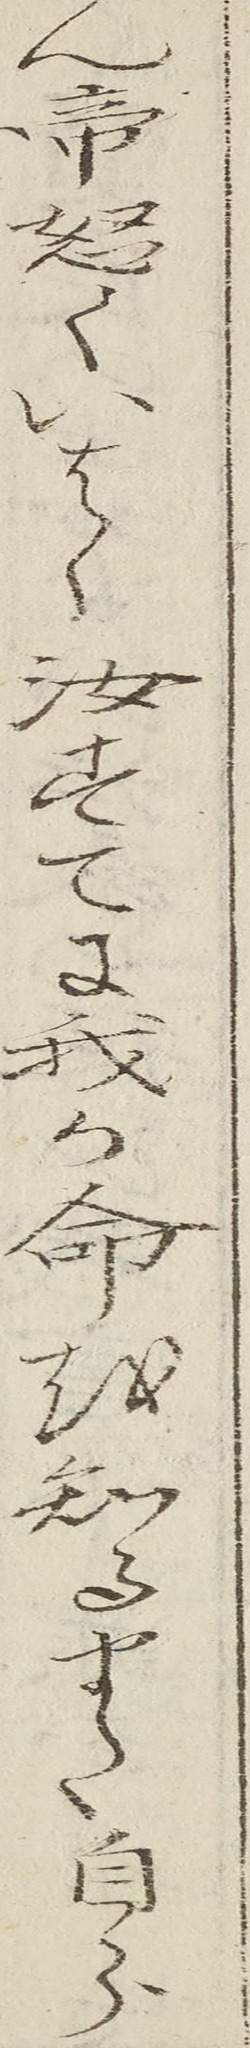ん帝怒ていはく汝すてに我か命知るまた自ら
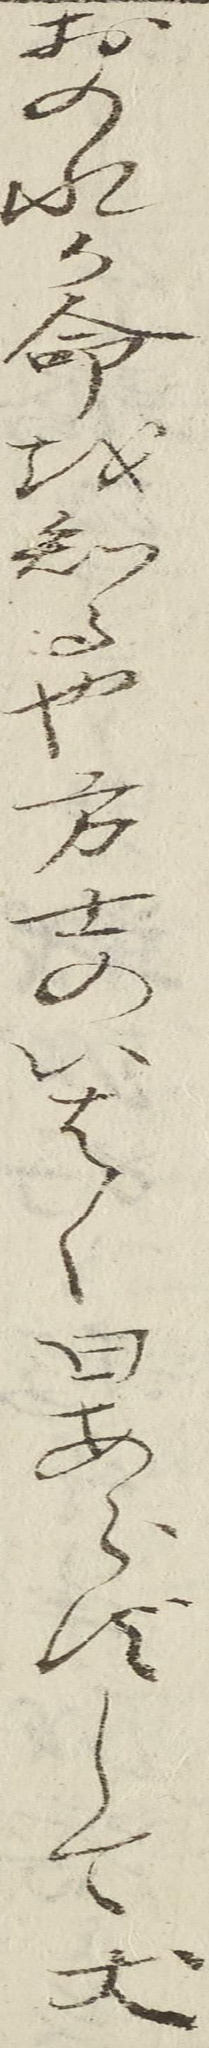おのれの命を知るや方士のいはく日あらすして犬
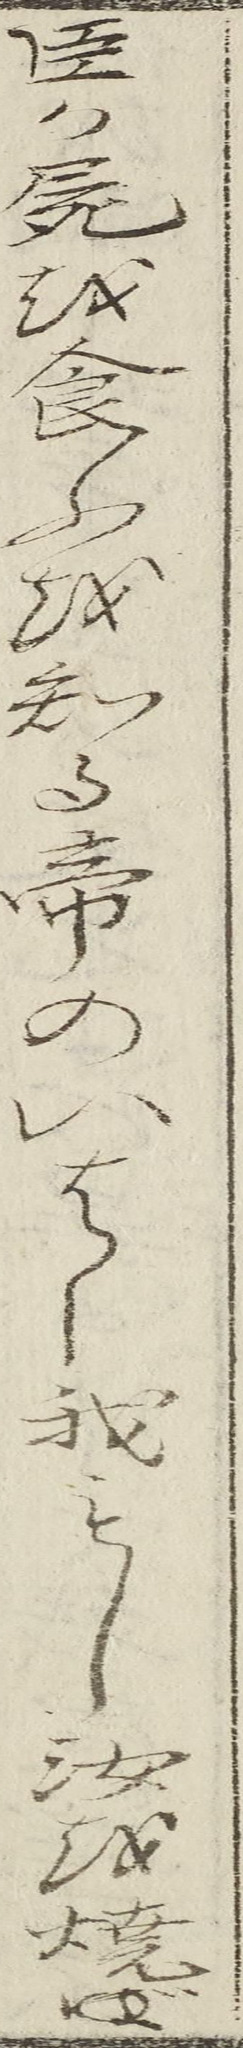臣か屍を食ふを知る帝のいはく我もし汝を焼い
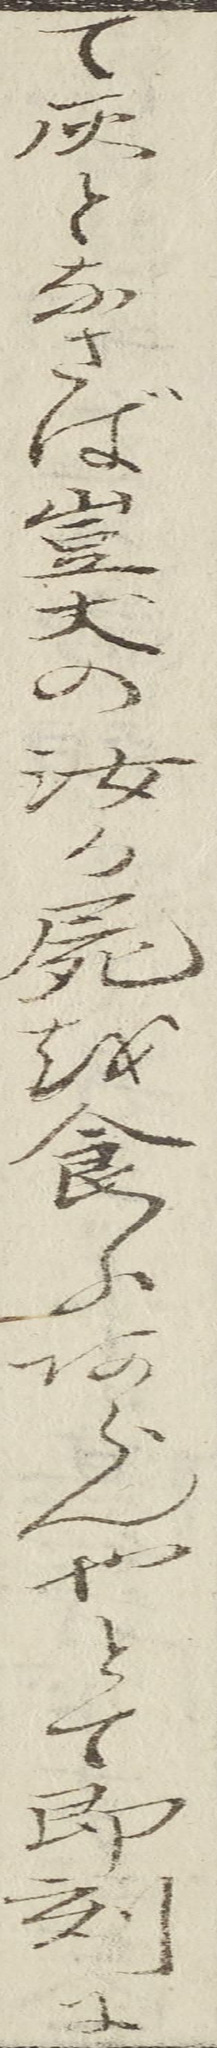て灰となさば豈犬の南汝か屍を食ふあらんやとて即刻に
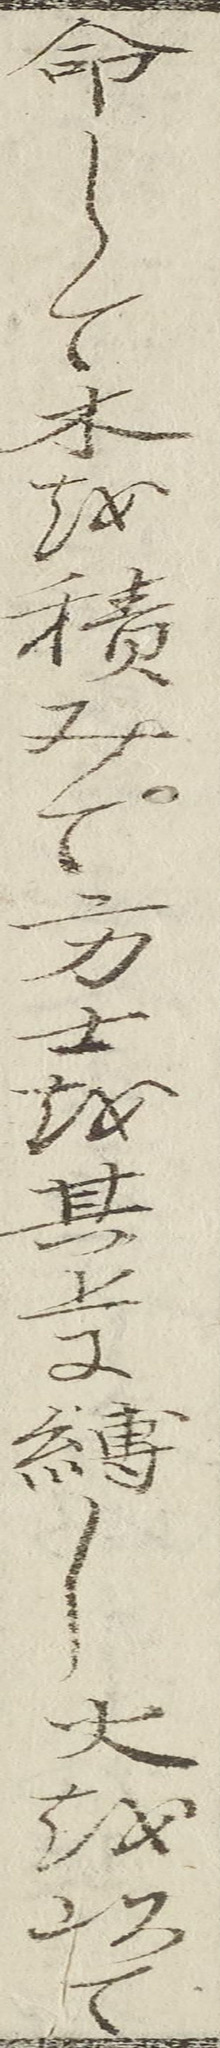命して木を積みて方士を其上に縛し火を以て
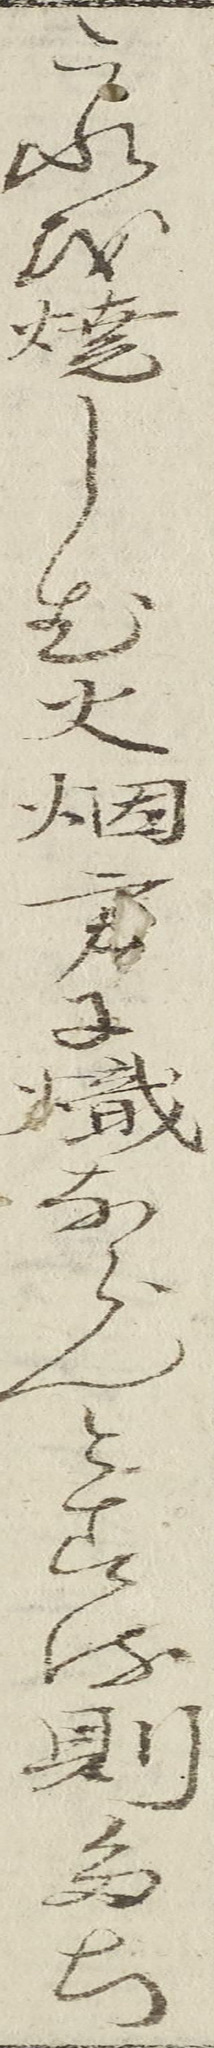これを焼しむ火烟方に熾ならんとする則たち
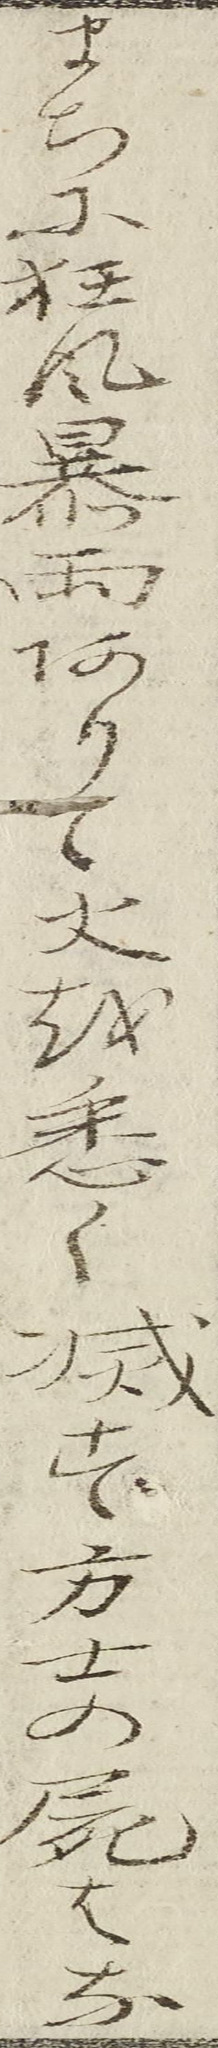まち狂風暴雨ありて火を悉く滅す方士の屍はな
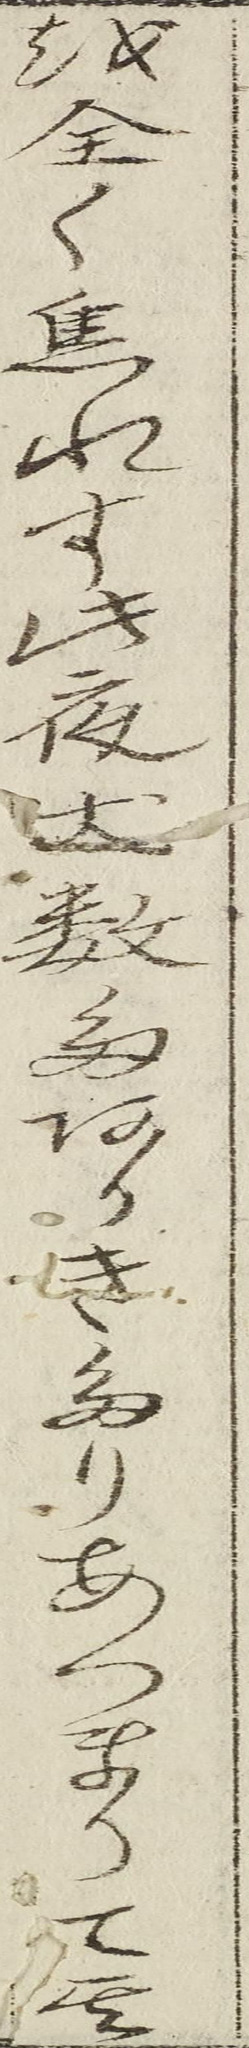を全く焦れす此夜犬数多ありきたりあつまりて其
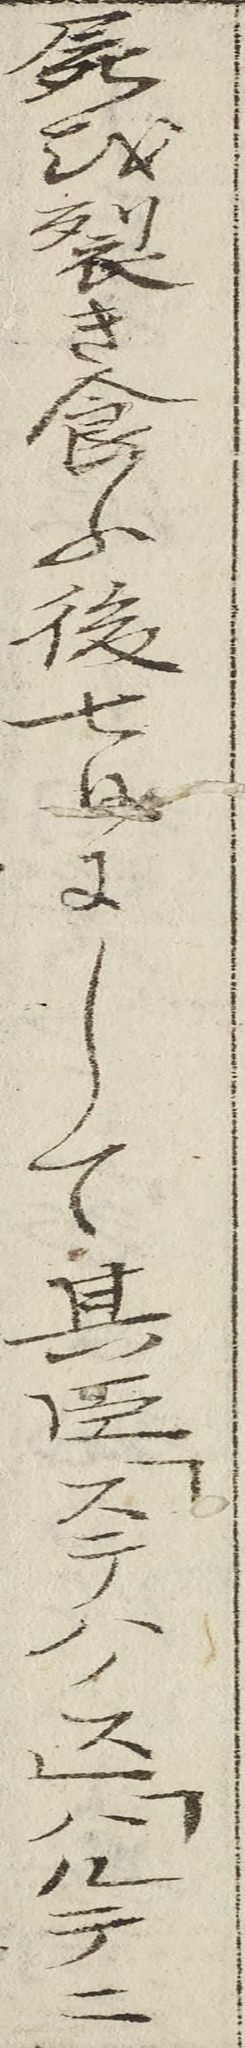屍を裂き食ふ後七日にして其臣「ステハノス」「ハルテニ
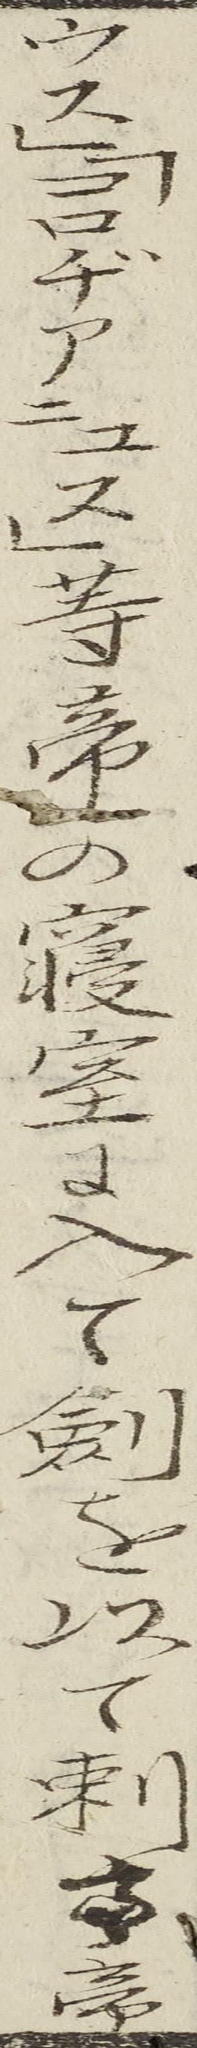ウス」「コロヂア二ュス」等帝の寝室に入て剣をを以て刺す帝
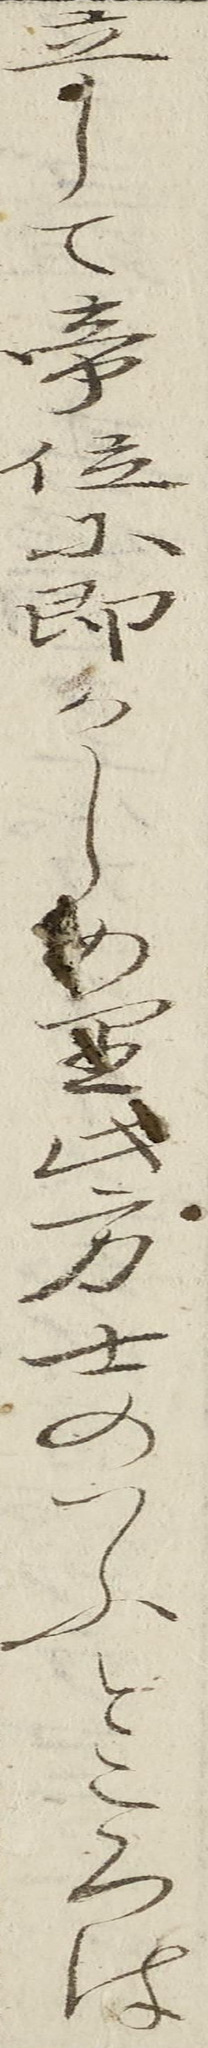立して帝位に即かしたり此方士のいふところは
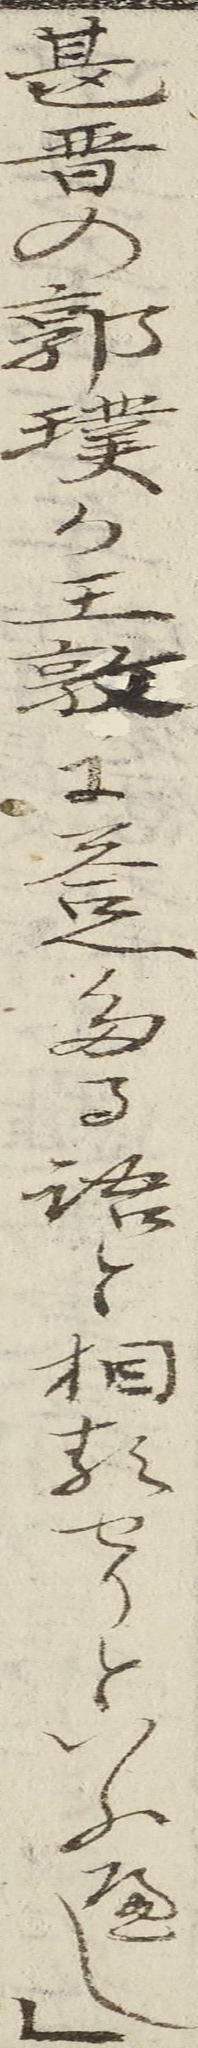甚晋の郭璞の王敦に登たる語と相類せりといふへし」
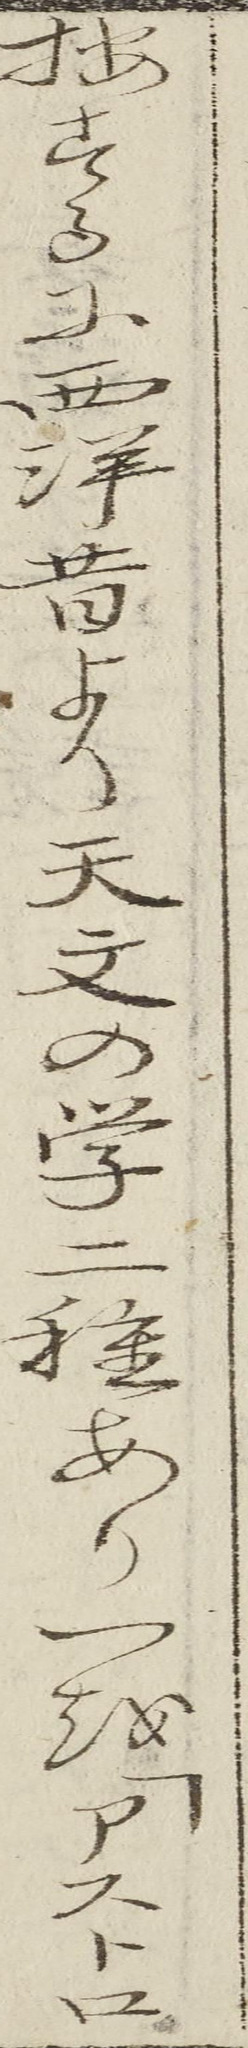按するに西洋昔より天文の学に種ありつを「アストロ
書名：西洋雜記　乾
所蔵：東京大学地震研究所図書室 Earthquake Research Institute Library, The University of Tokyo, JAPAN
